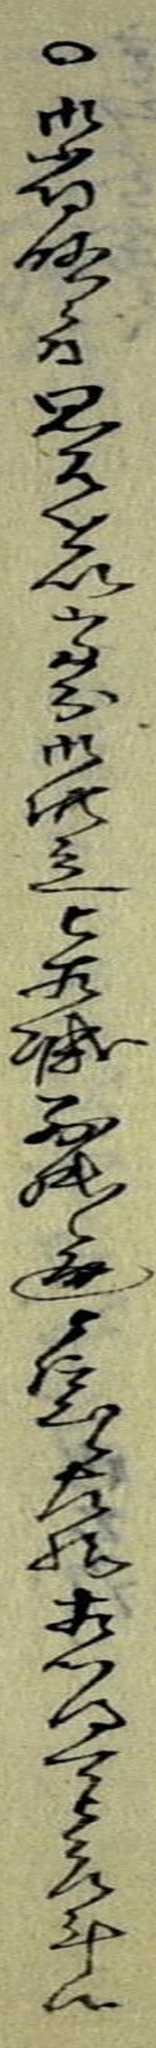○御省略に付思召を以当分御供立被相減別紙之通被仰出候左様相心得可被取斗候
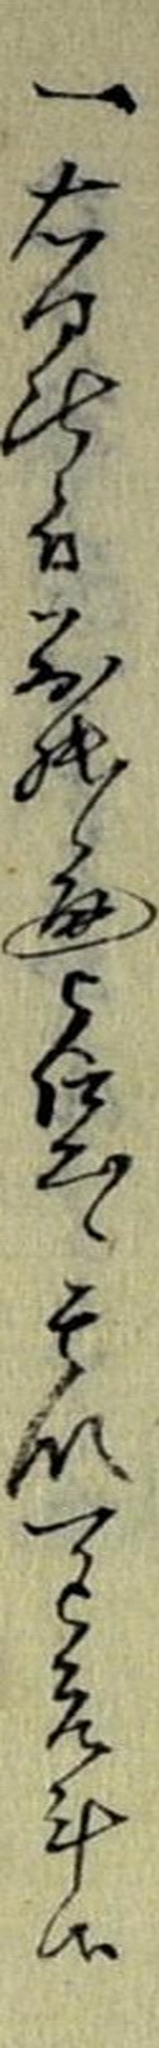一右同断に付別紙之通被仰出候其段可被取斗候
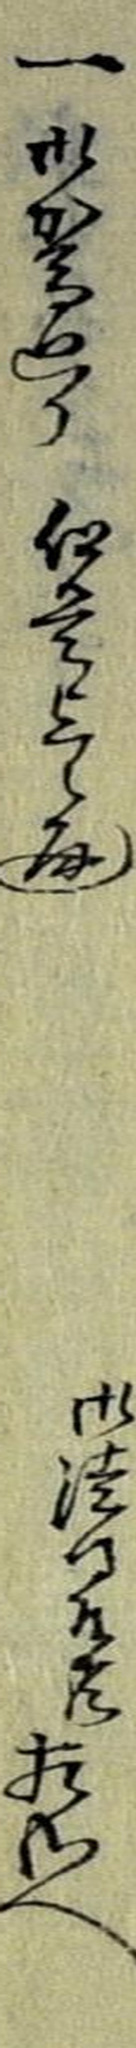一御駕廻り但是迄之通御徒目付共拾弐人
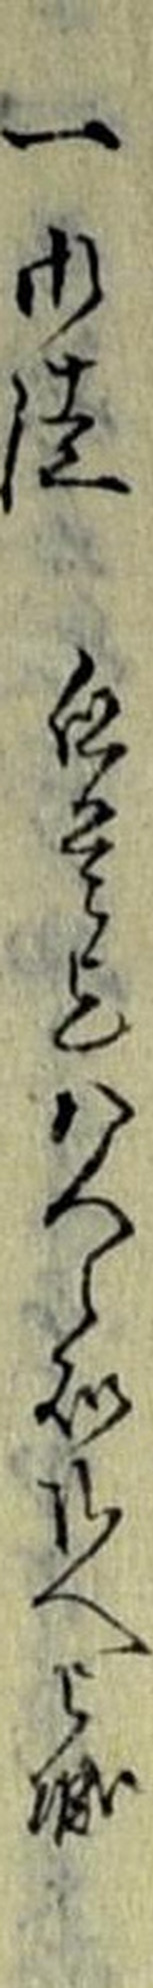一御徒但是迄八人之処弐人被減六人
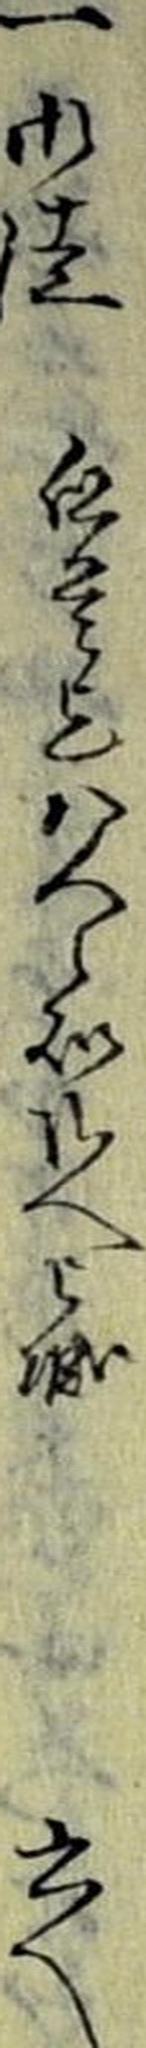一御徒但是迄八人之処弐人被減六人
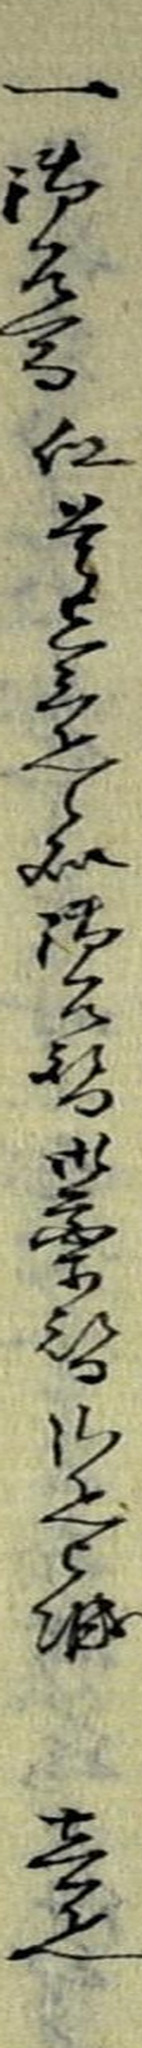一御召馬但是迄三疋之処御召替御牽替弐疋被減壱疋
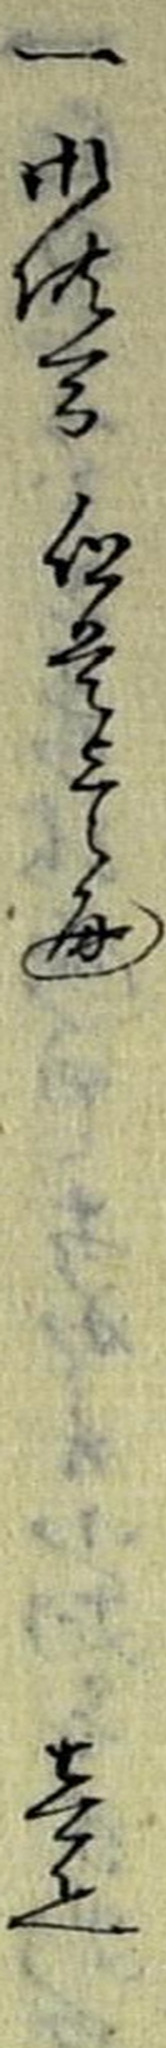一御供馬但是迄之通壱疋
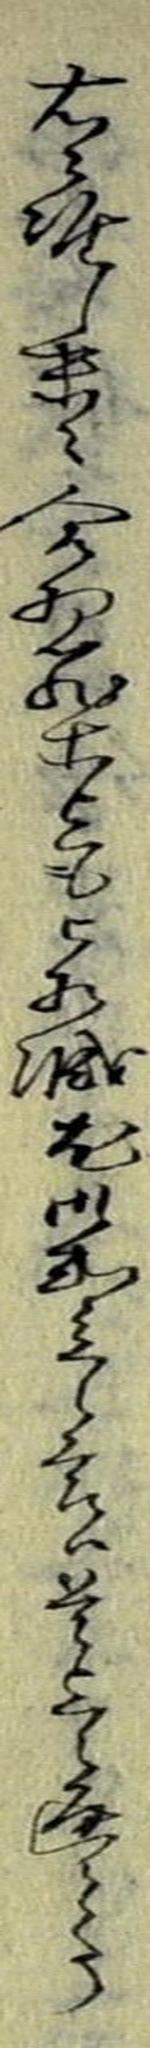右に准し末々合羽蔵等迄も被相減尤御式立之節は是迄之通候事
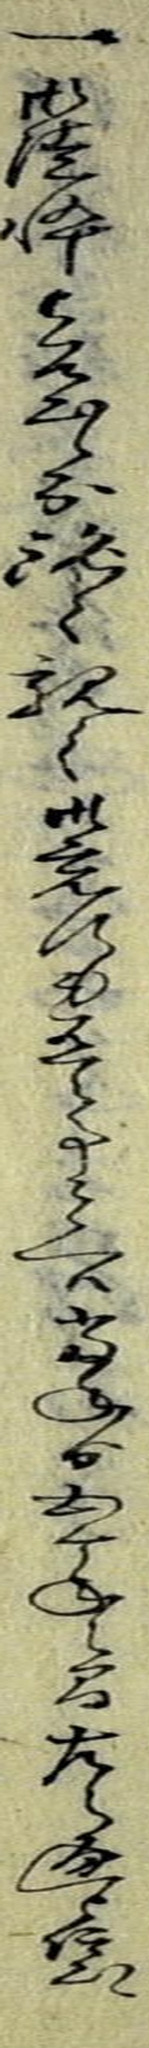一御徒忰被召出候分銘々親之御充行も有之事に候へは当年ゟ五ケ年之間左之通被仰出候
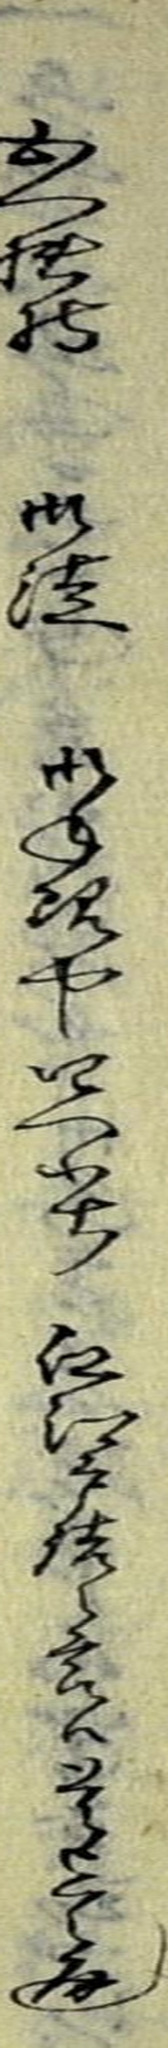五人扶持御徒御年限中四人ふち但江戸表之節は是迄之通
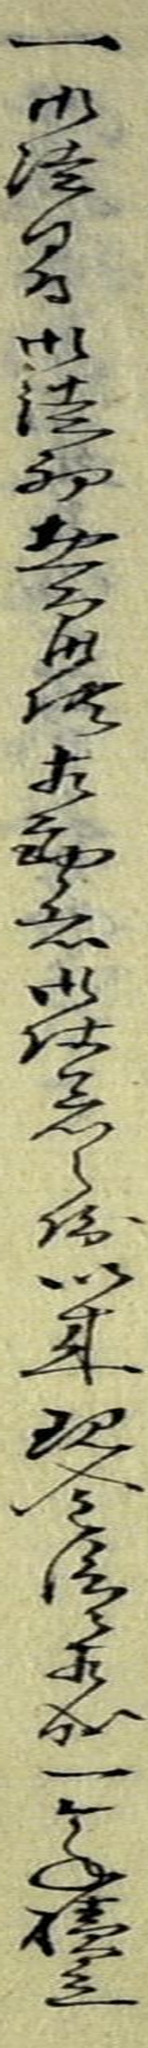一御徒目付御徒初惣而御供相勤候者御仕着之儀以来現金渡に相成一ヶ年積立
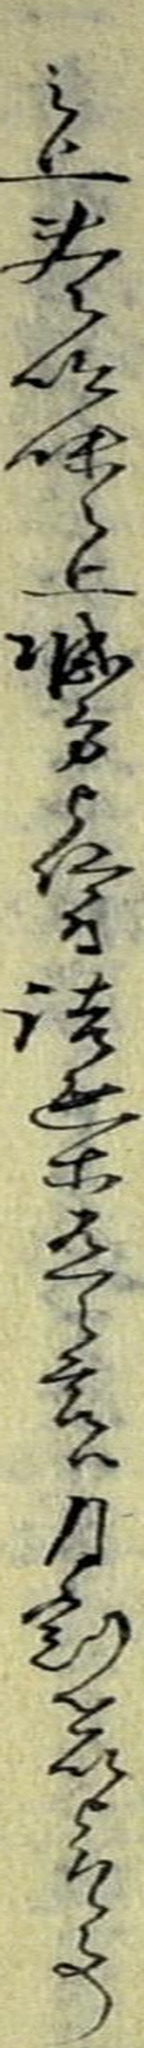之上夫々吟味之上減方被仰付詰延等有之節は月割を以被下候事
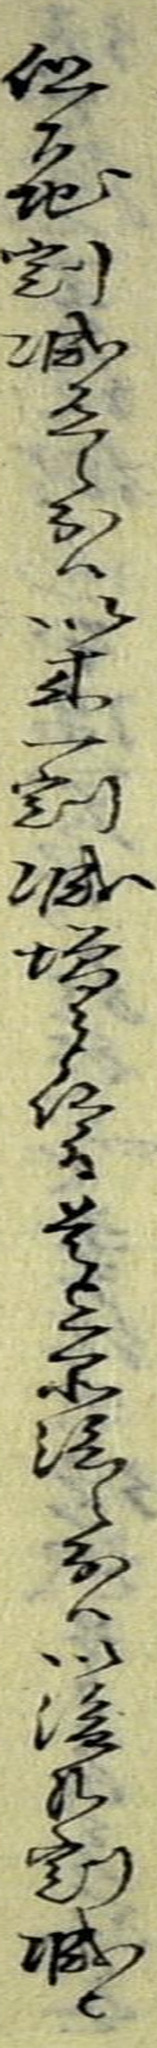但下地割減有之分は以来一割減増に被仰付是迄品渡之分は以後弐割減被
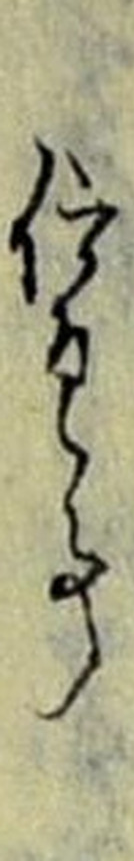仰付候事

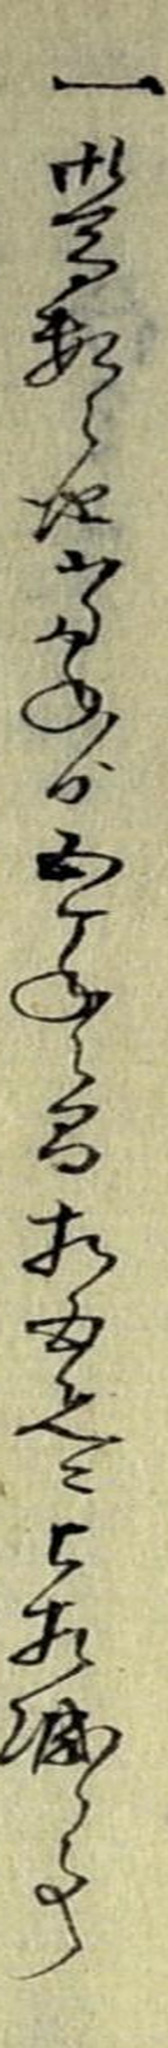一御馬数之儀当年ゟ五ヶ年之間拾五疋に相減候事
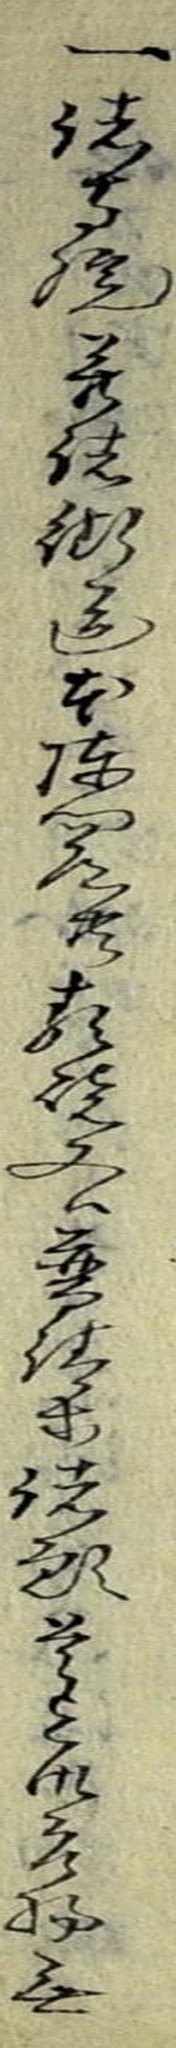一諸寺院并諸街道本陣問屋共類焼又は普請等諸願是迄御取扱無
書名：命令之部 六
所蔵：福井県文書館 Fukui Prefectural Archives
